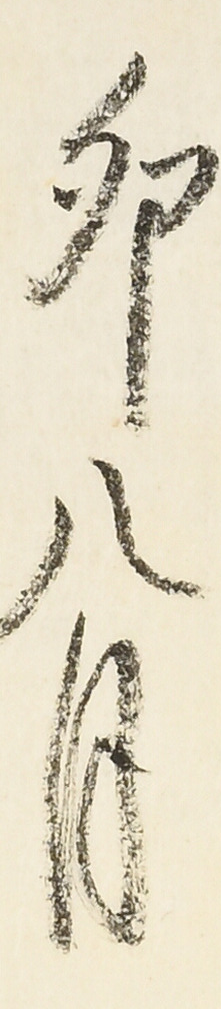卯八月
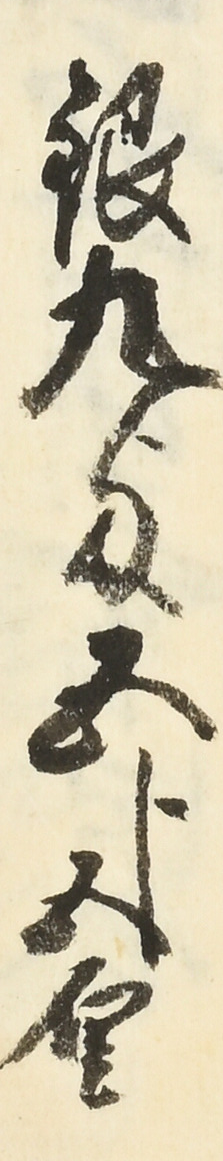銀九匁四分七厘

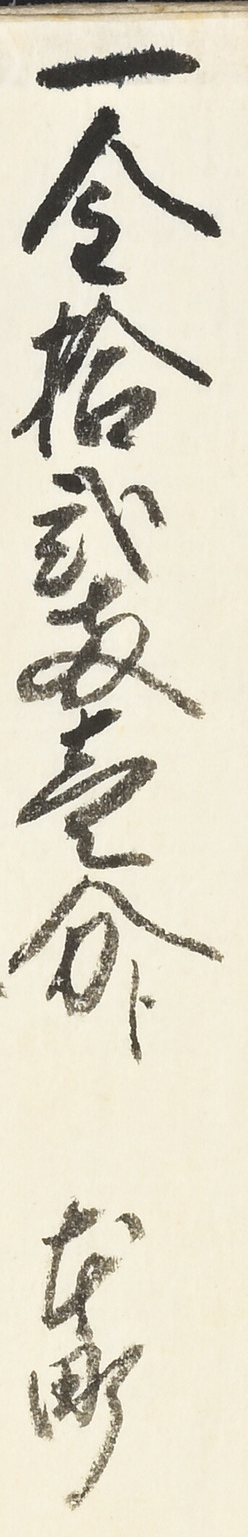一金拾弐両壱分ト本町
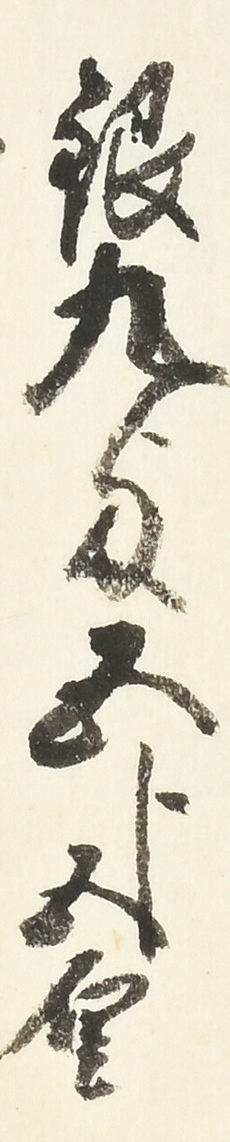銀九匁五分五厘
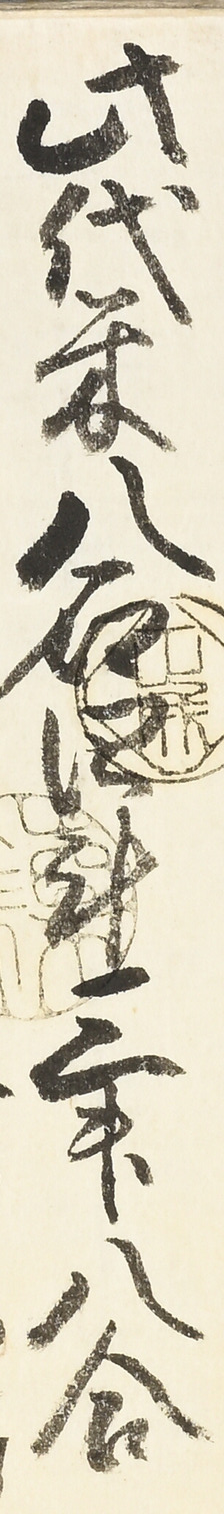此代米八石四斗三升八合
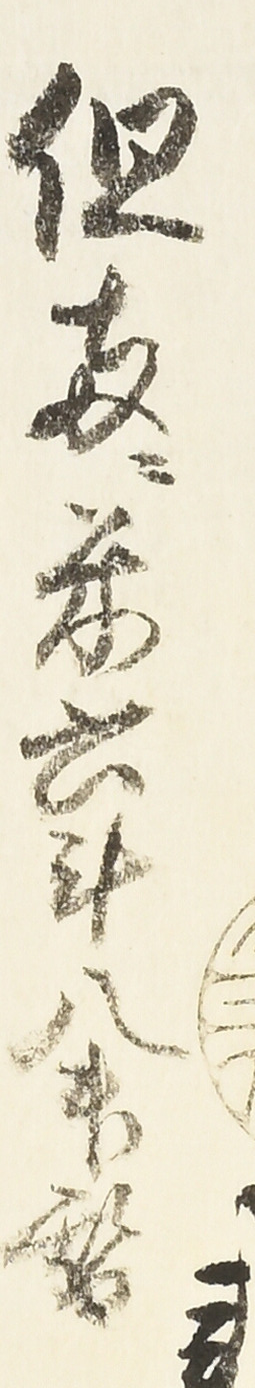但両ニ米六斗八升替
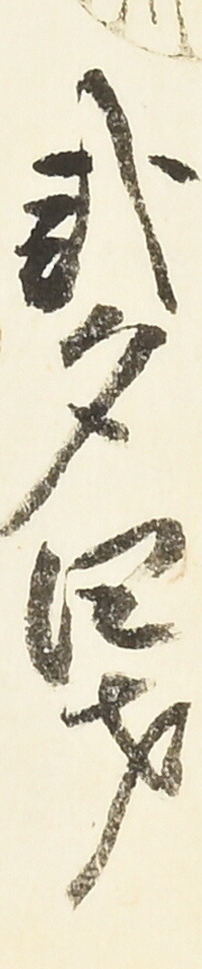弐勺四才
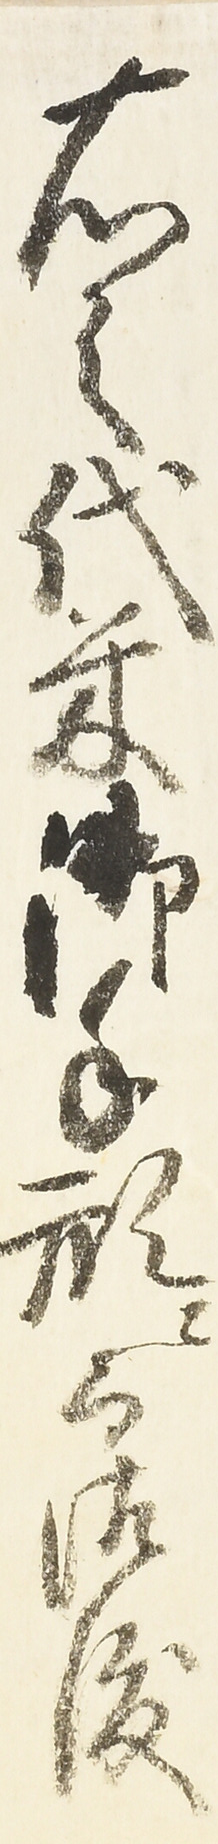右之代米御手形ニ而御渡
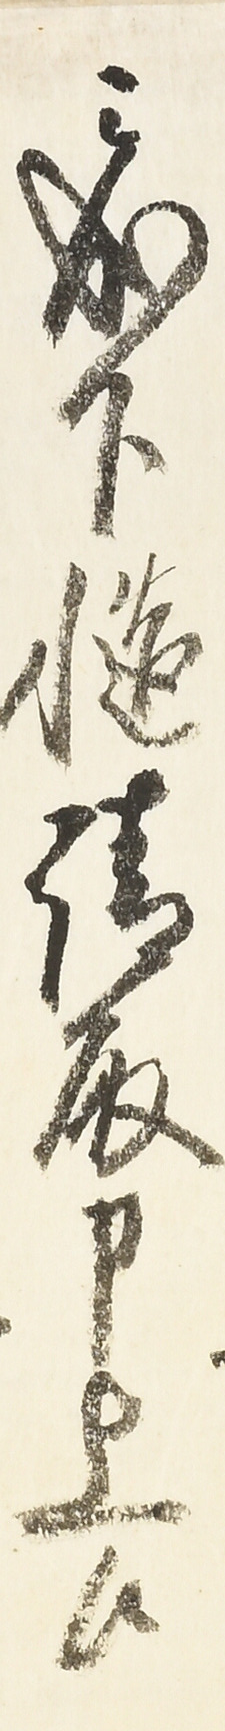被成下慥請取申上候
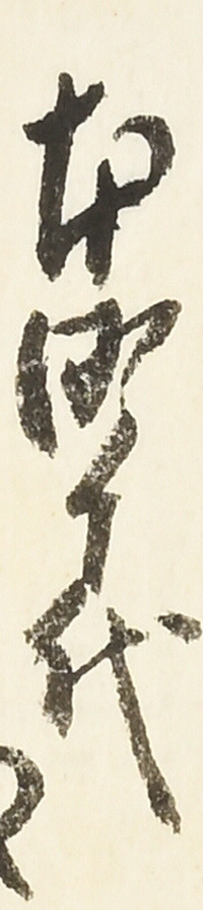本町丁代
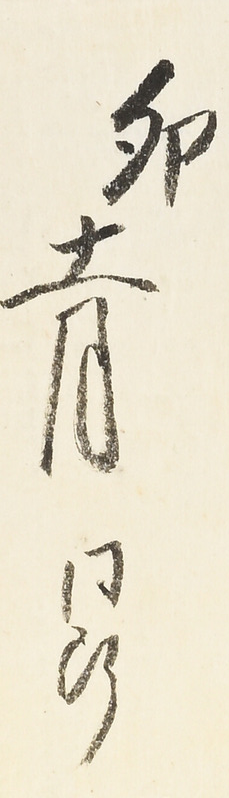卯十一月同断
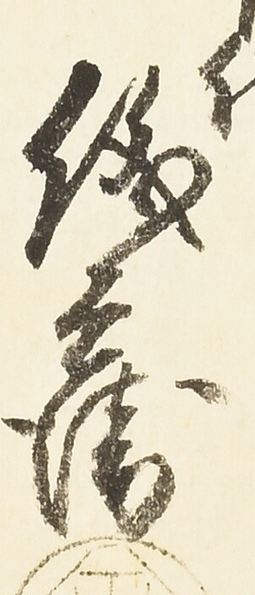儀兵衛
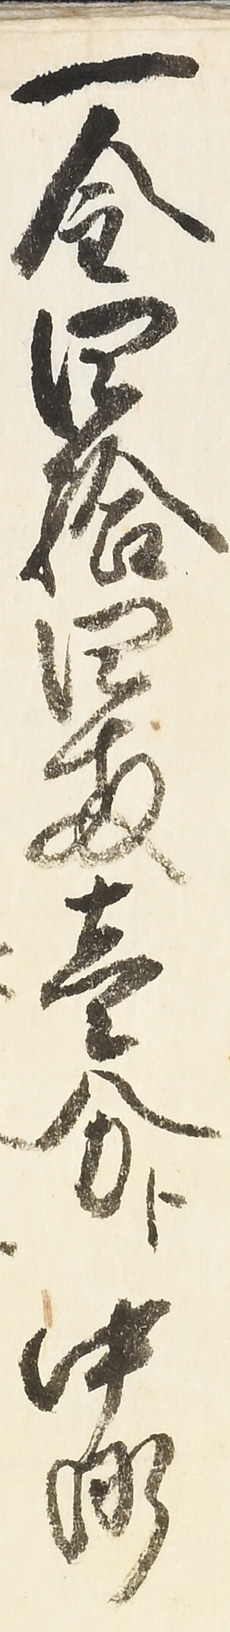一金四拾四両壱分ト中町
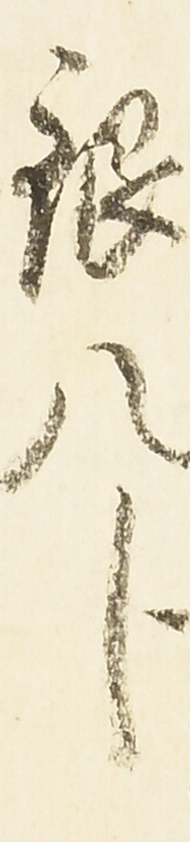銀八分
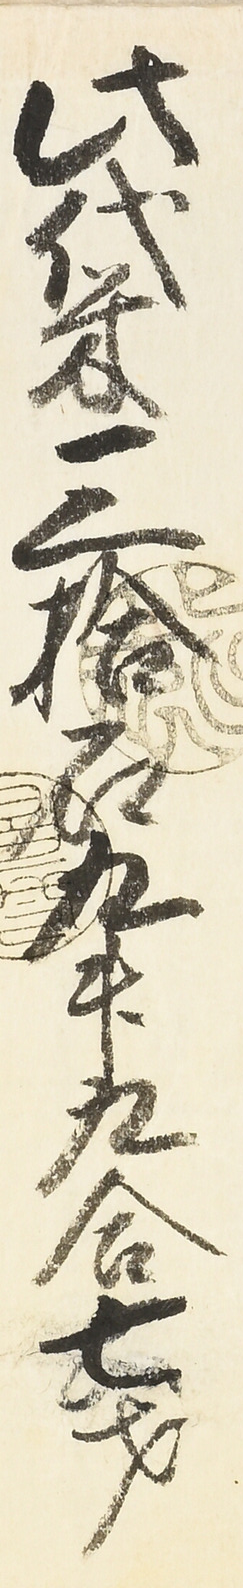此代米三拾石九升九合七才
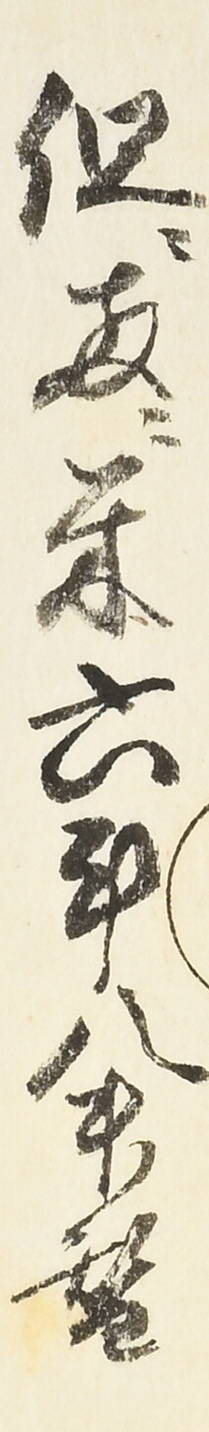但両ニ米六斗八升替
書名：御才覚金御利足割渡扣帳
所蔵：伊那市立高遠町図書館・合同会社AMANE
